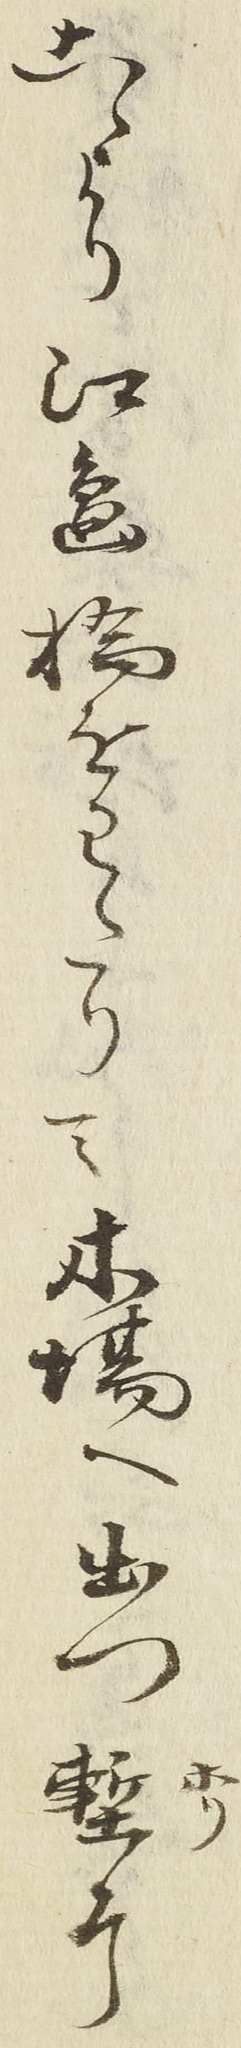こゝより江島橋をわたりて木場へ出つ塹に
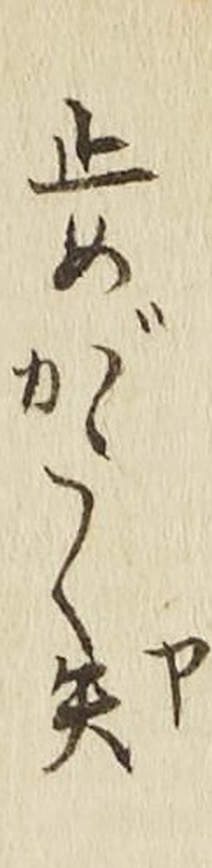止めがたく矢
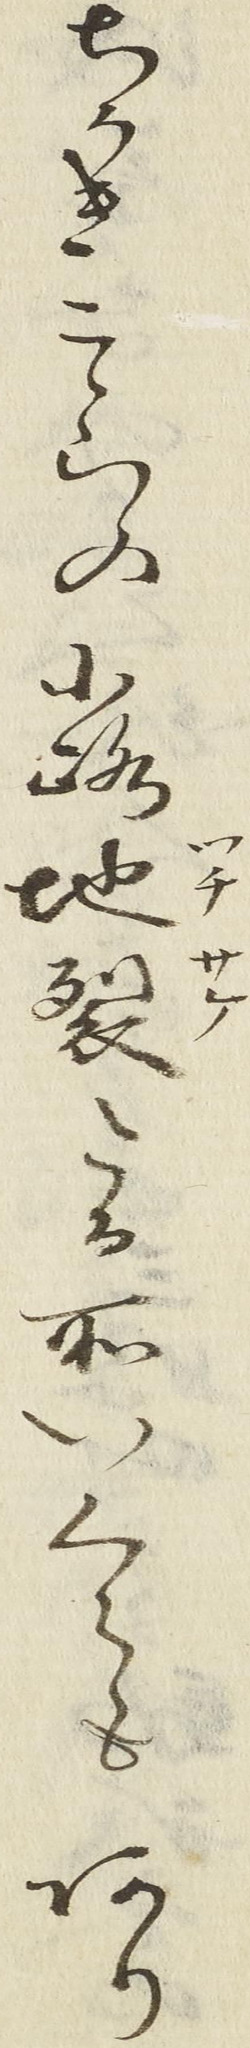ちかきこゝらの小路土裂たる所いくらもあり
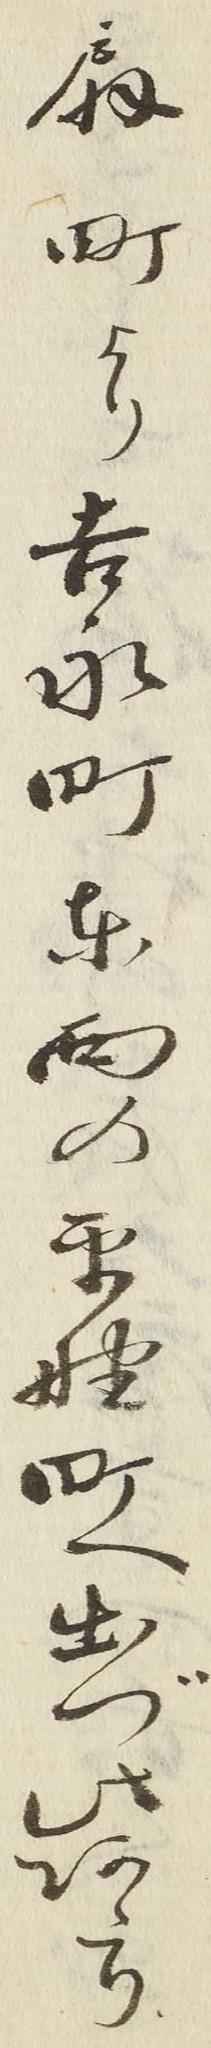扇町より吉永町東西の平野町へ出づ此あたり
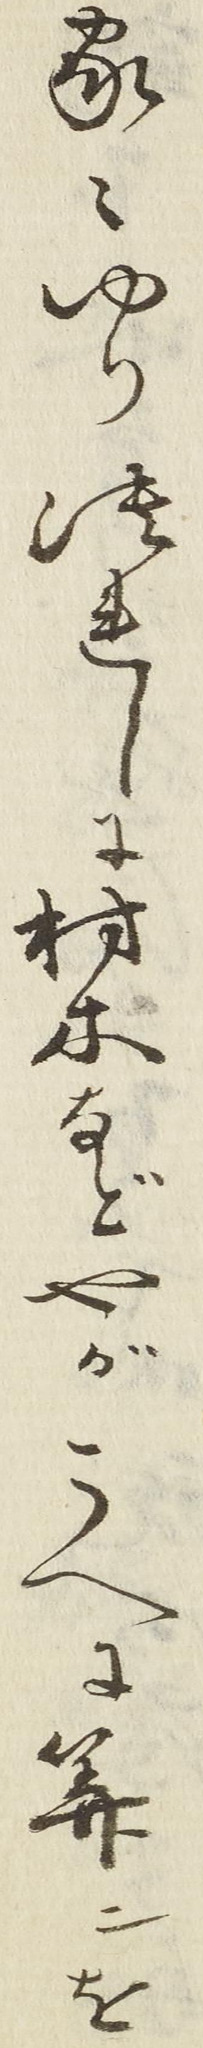家〻ゆり潰れしに材木などやがうへに算？
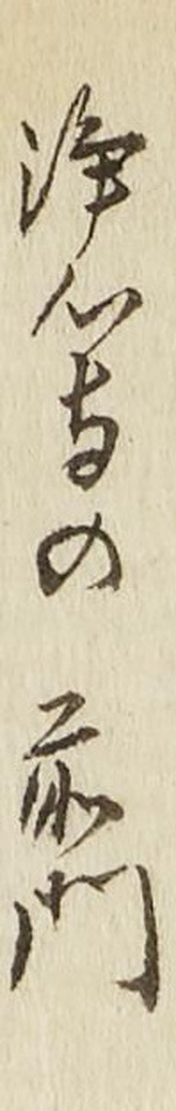浄心寺の門前
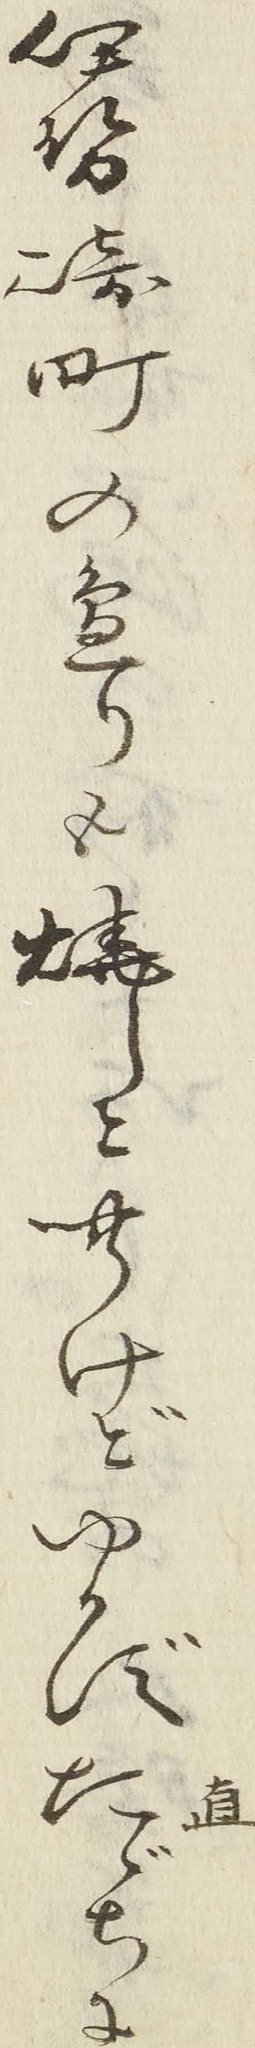伊勢崎町の辺りも焼しと聞けどゆかずたゞ直ちに
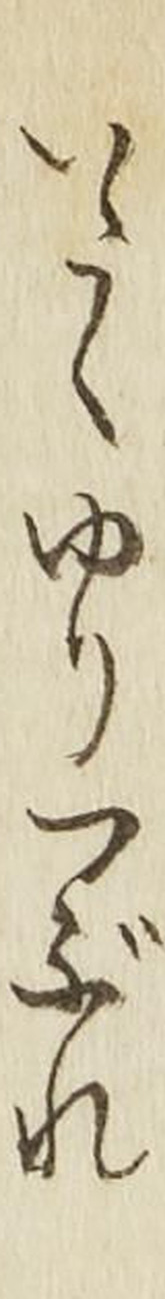いたくゆりつぶれ
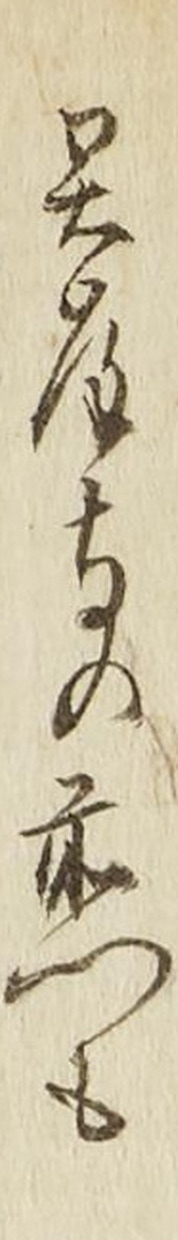霊岸寺の門前も
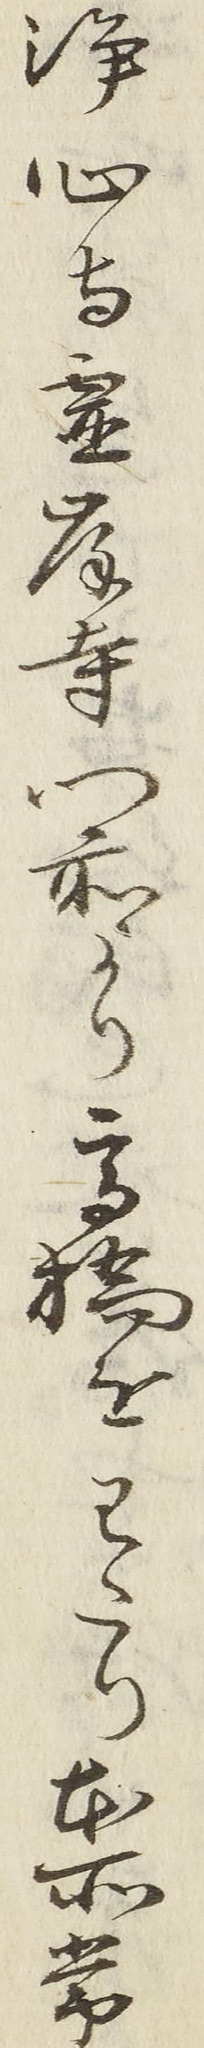浄心寺霊岸寺門前より高橋をわたり本所常
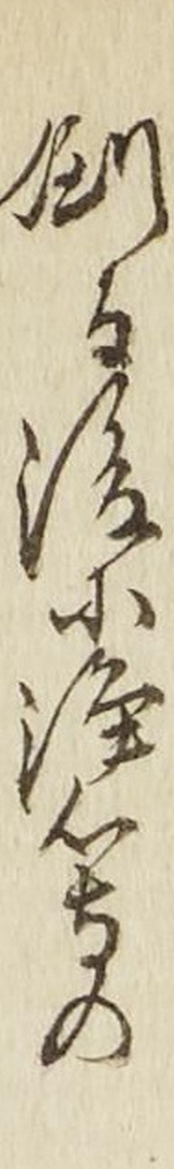倒る後に浄心寺の
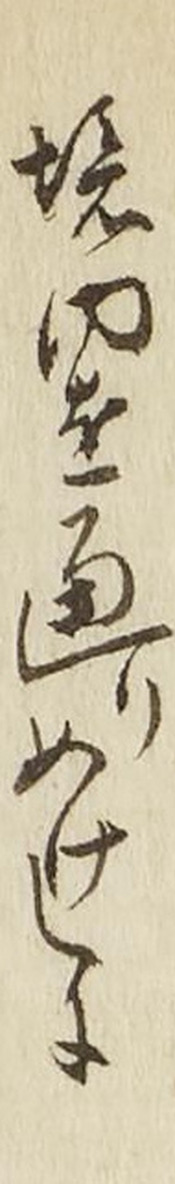境内を通りぬけしに
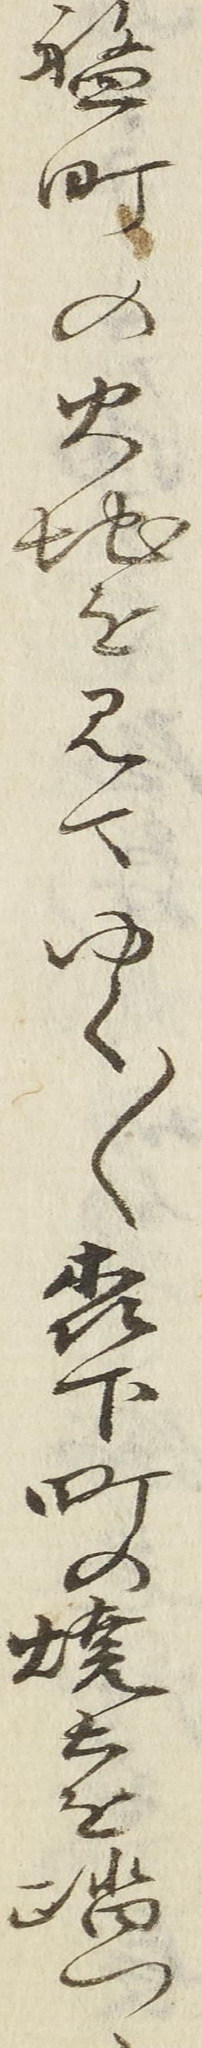盤町の火地を見てゆく〳〵森下町の焼土を踏つゝ
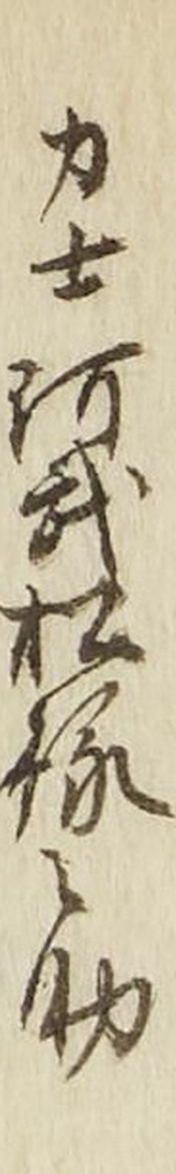力士阿武松緑之助
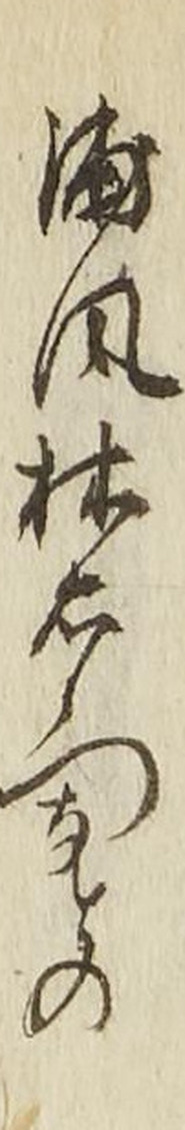浦風林右衛門なとの
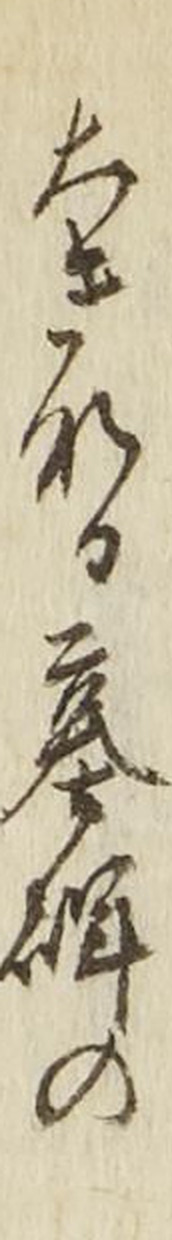大きなる墓碑の
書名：やぶれ窓の記　全
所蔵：東京大学地震研究所図書室 Earthquake Research Institute Library, The University of Tokyo, JAPAN
